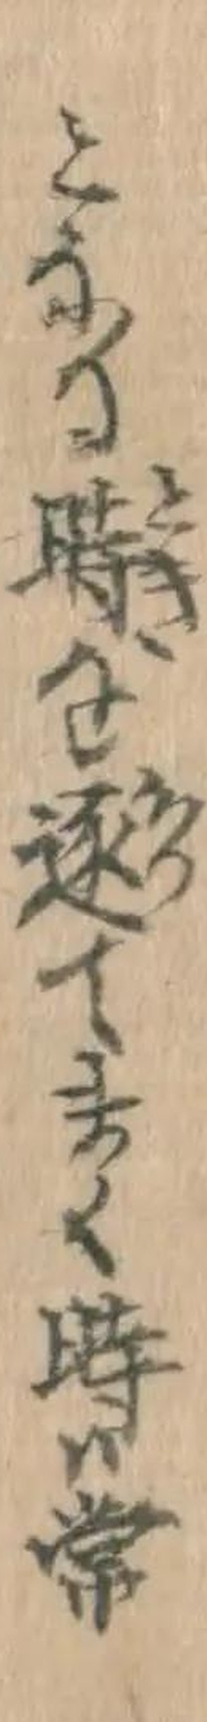となる時を逐てまく時は常

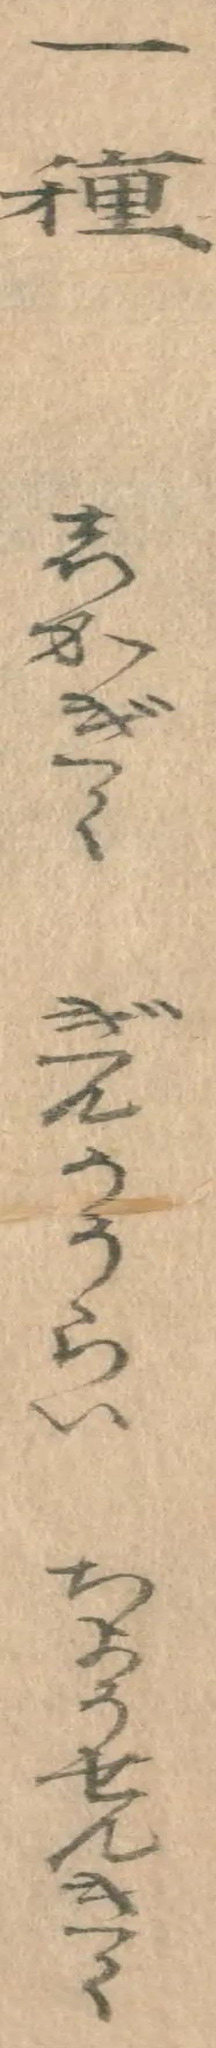一種しかぎくぎんかうらいちようせんきく
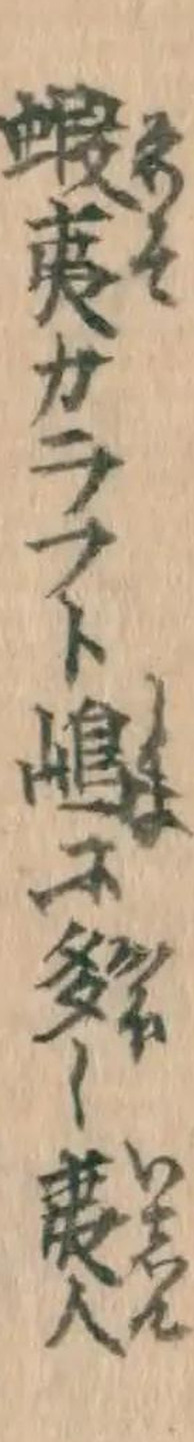蝦夷カラフト嶋に多夷人
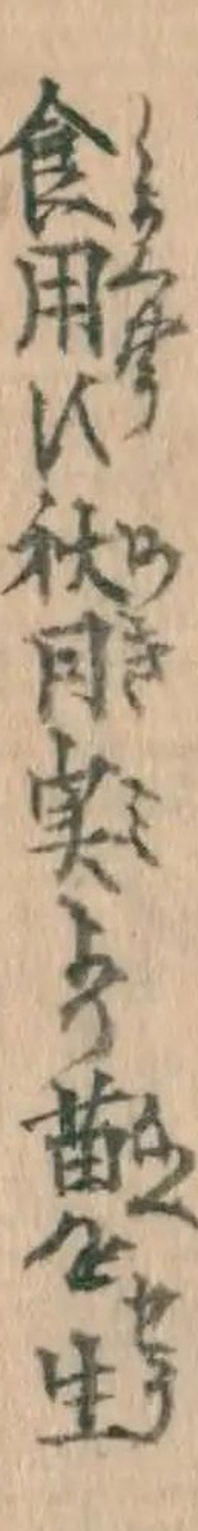食用す秋月実より苗を生
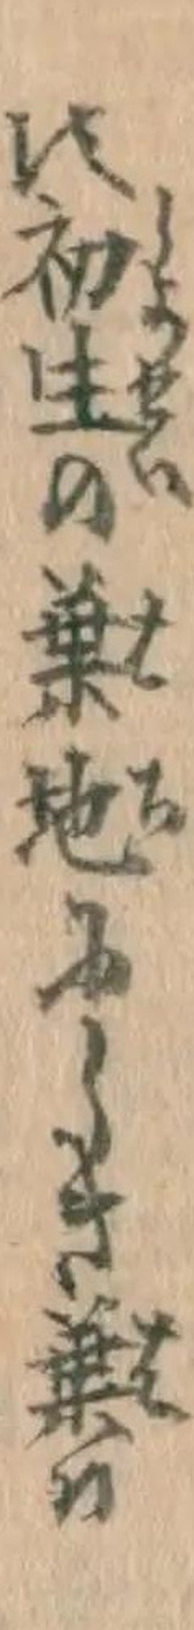す初生の葉地にしき葉は
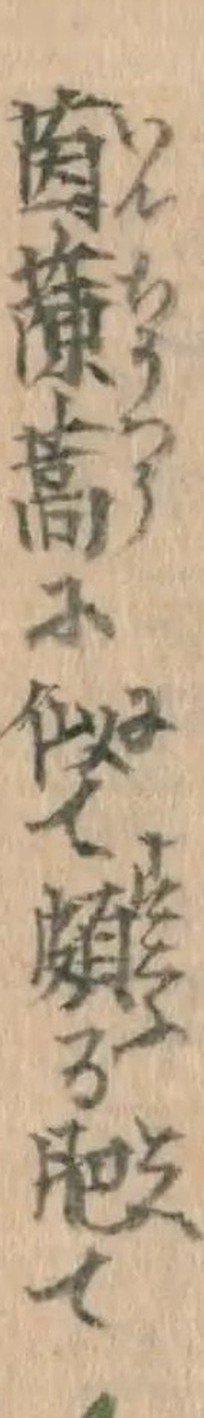茵蔯蒿に似て頗る肥て
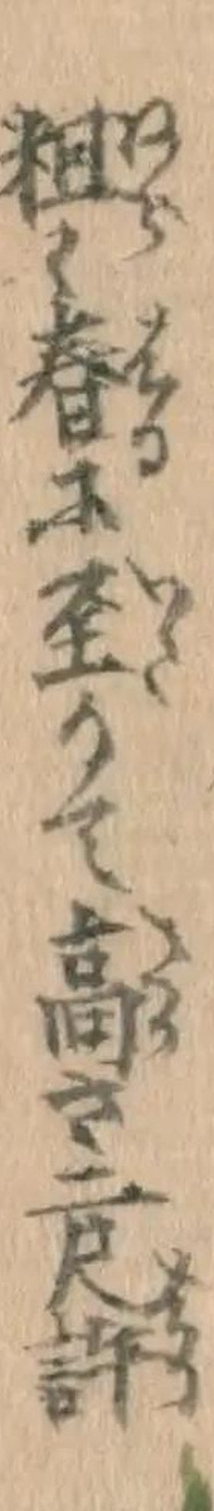粗く春に至りて高さ二尺許
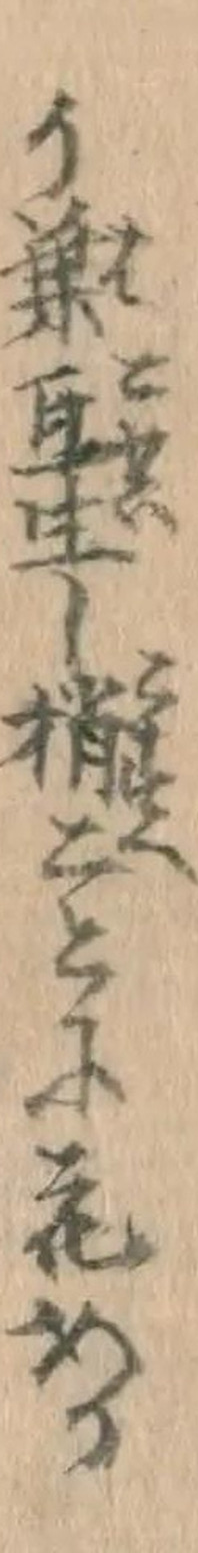り葉互生し梢ことに花あり
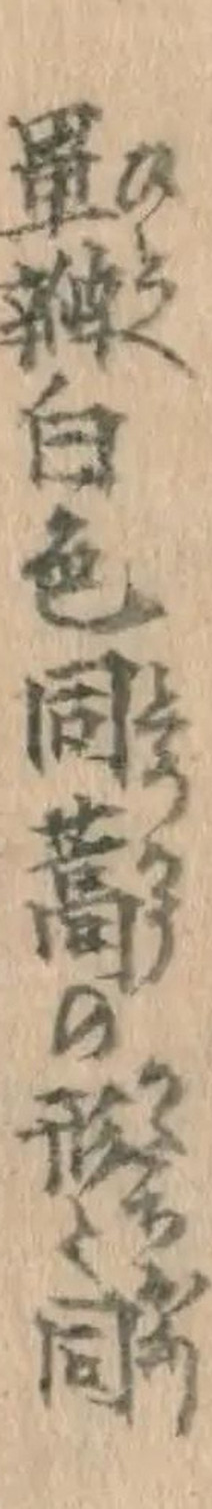単弁白色同蒿の形と同
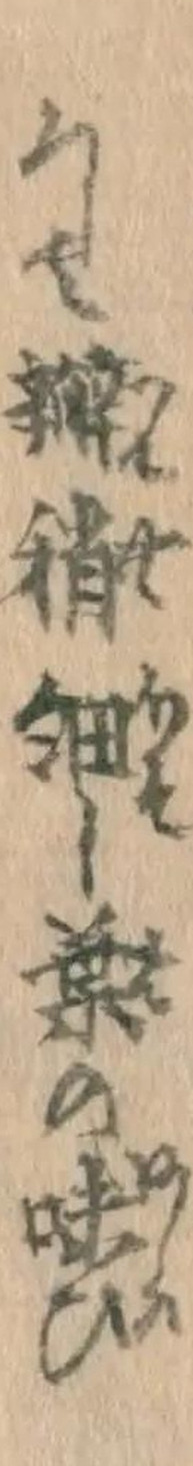くして弁稍細し葉の味ひ
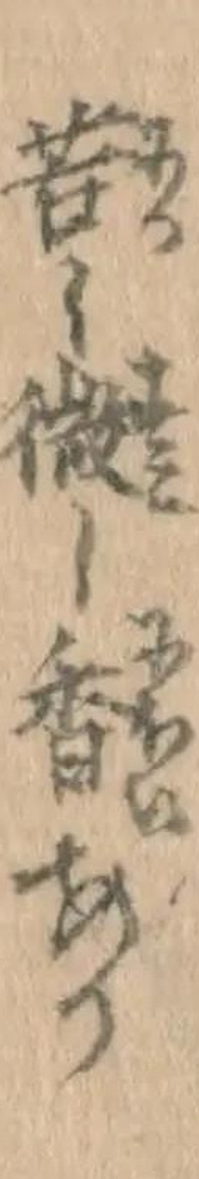苦微し香あり

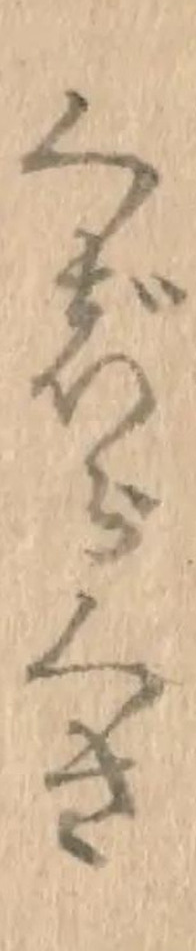くじらくさ
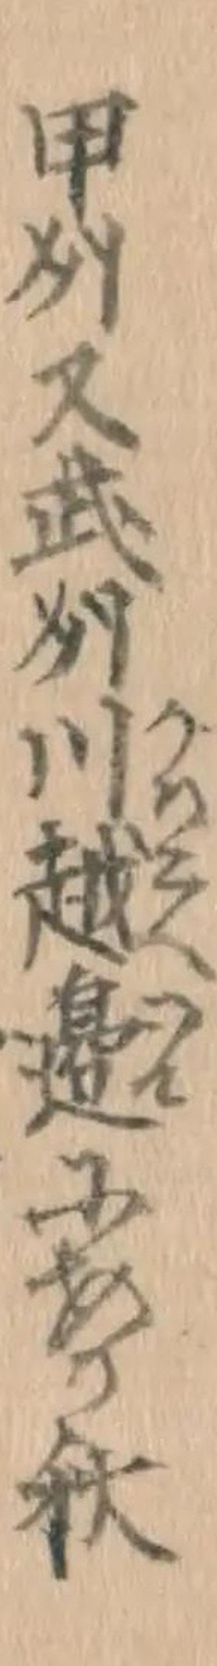甲州又武州川越辺にあり秋
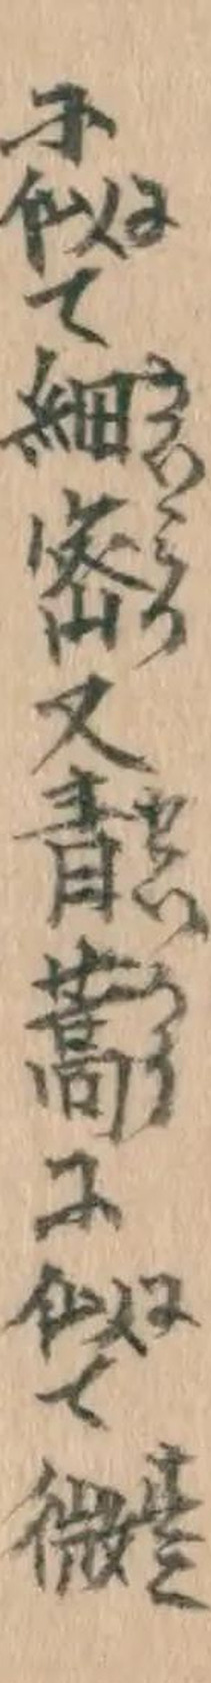に似て細密又青蒿に似て微
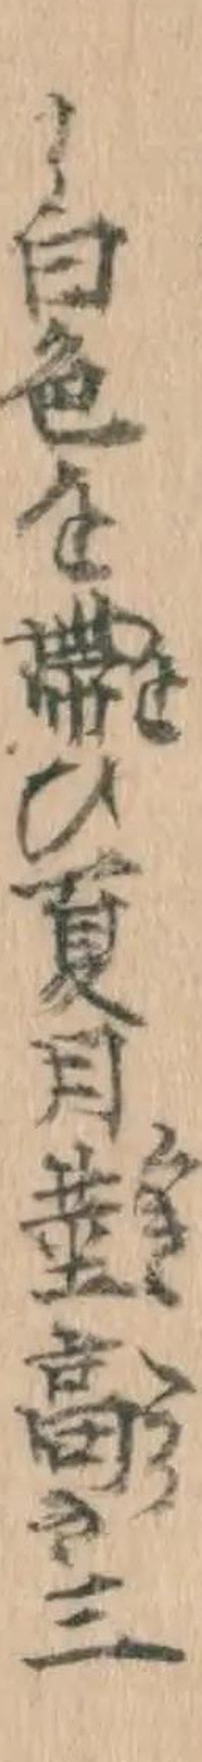し白色を帯ひ夏月茎高さ三
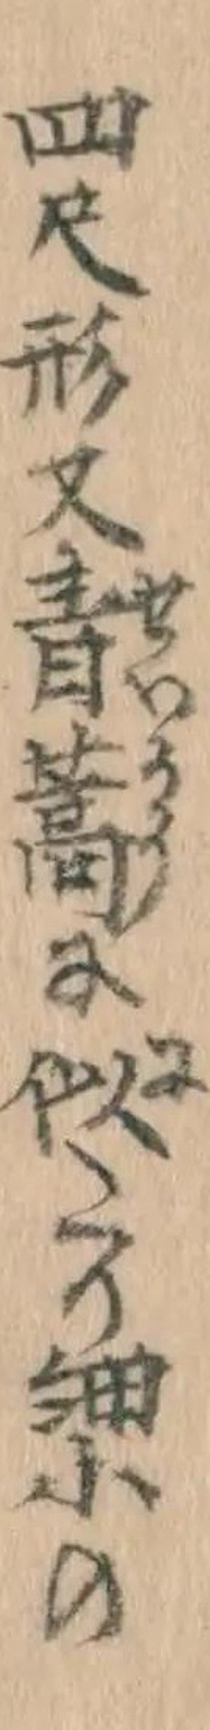四尺形又青蒿に似たり細小の
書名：本草図譜. 巻46-48
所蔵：国立国会図書館 National Diet Library, JAPAN
